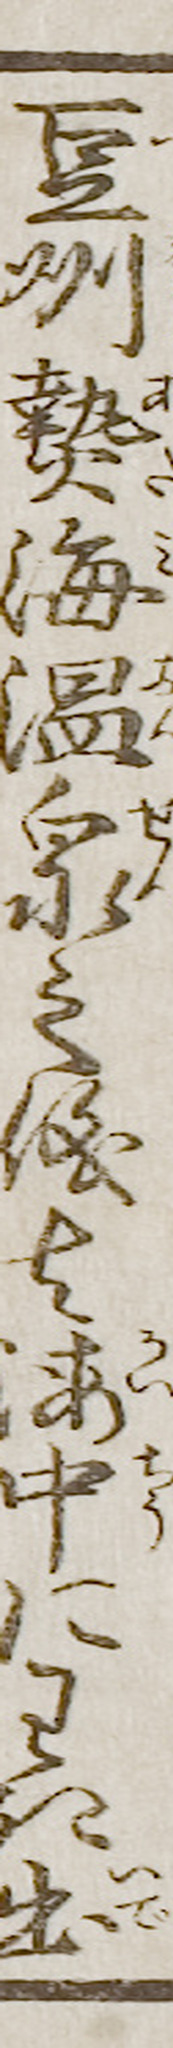豆州熱海温泉之儀は海中にわき出
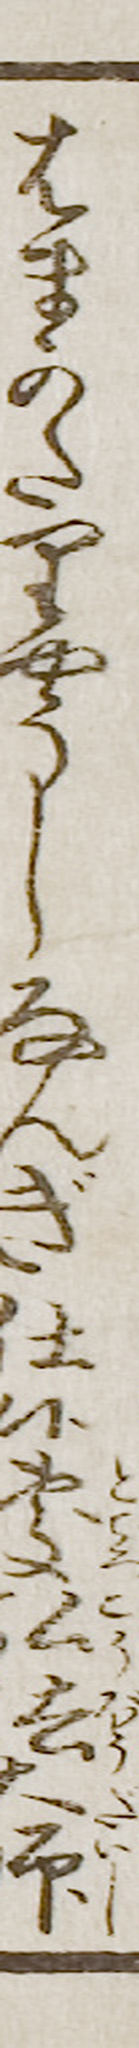はまかたりやうしなんぎ仕候處弘法大師
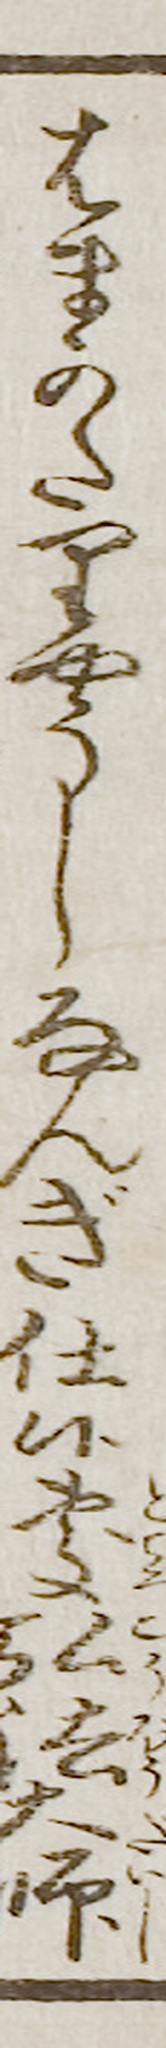はまかたりやうしなんぎ仕候處弘法大師
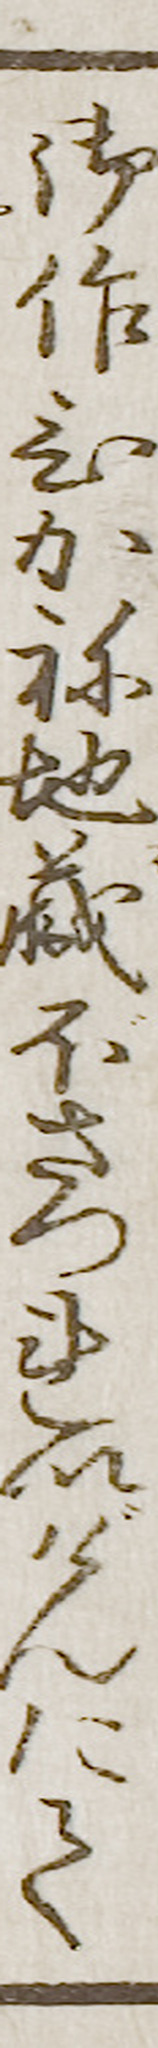御作ひかね地蔵ぼさつれいげんにて
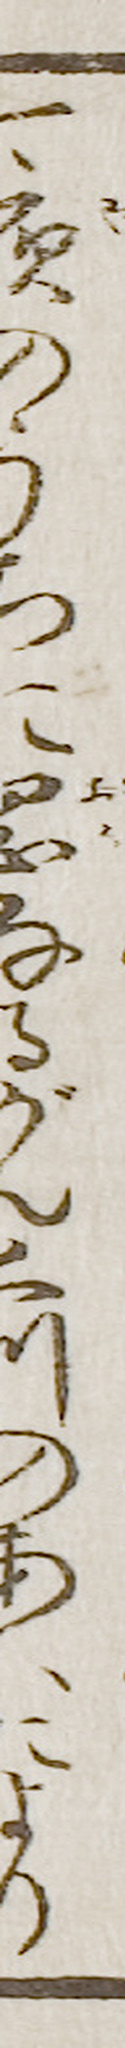一夜のうちに岡なるがんくつのあいたより
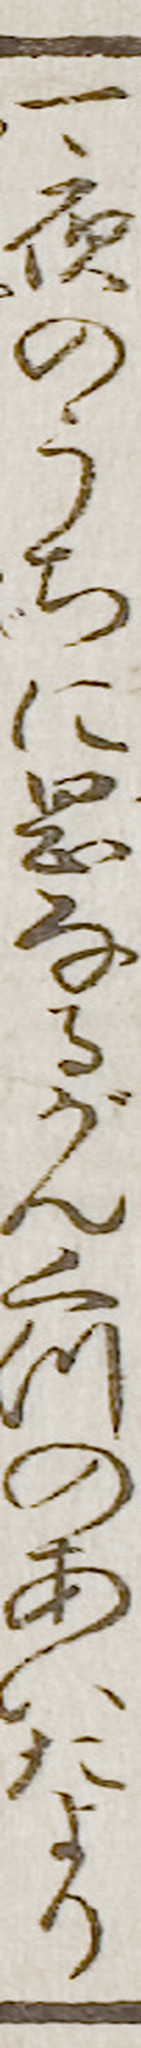一夜のうちに岡なるがんくつのあいたより
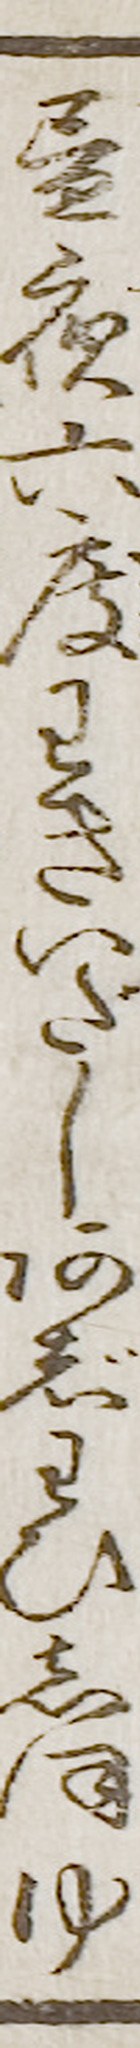昼夜六度わきいだしあじわひしほゆ
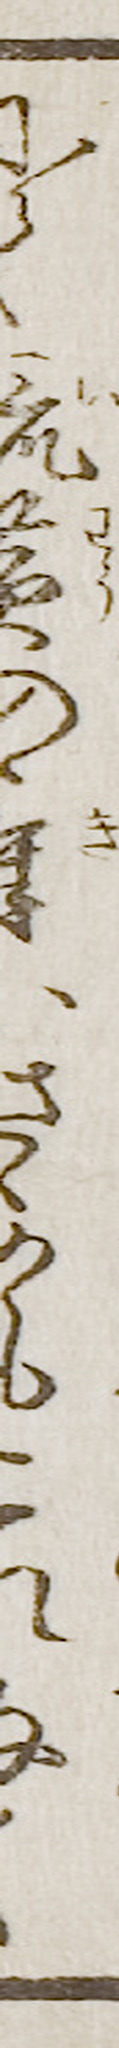にて硫黄の氣いさゝかもこれなく
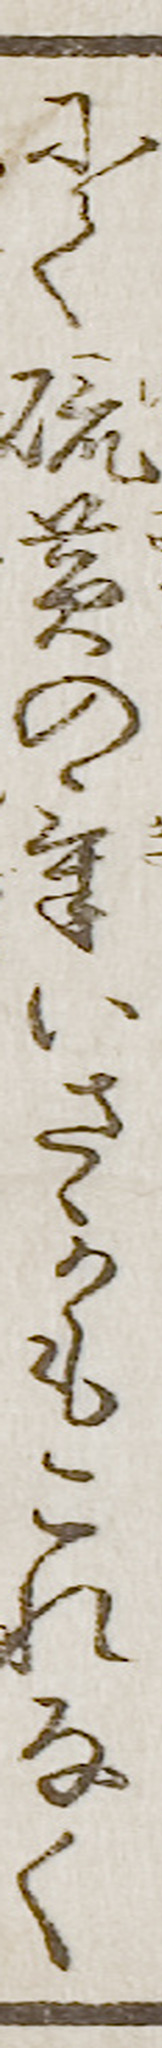にて硫黄の氣いさゝかもこれなく
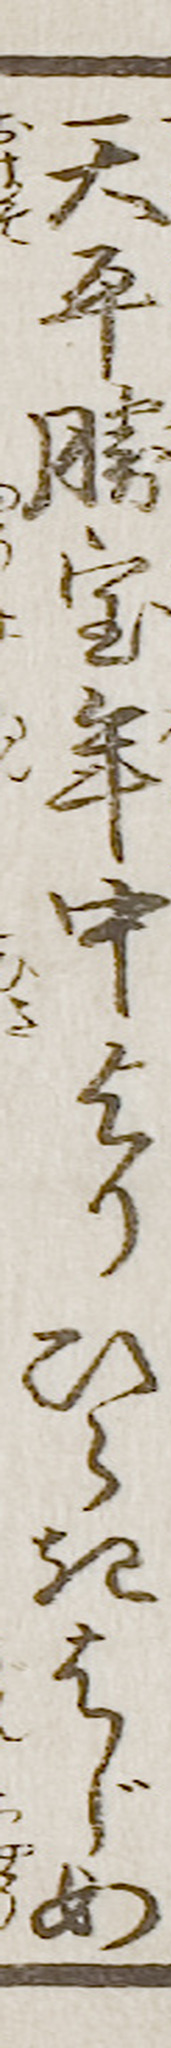天平勝宝年中よりひらきはじめ
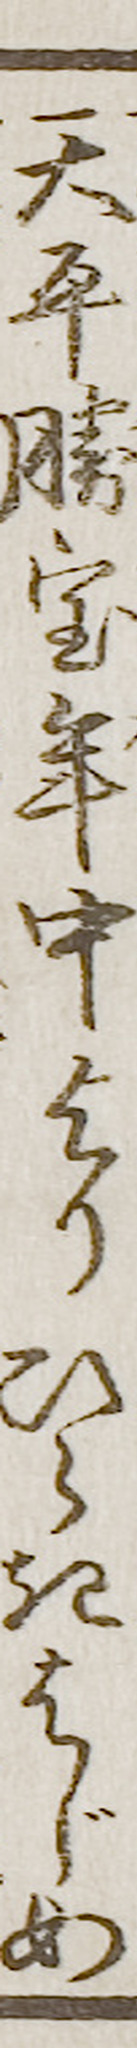天平勝宝年中よりひらきはじめ
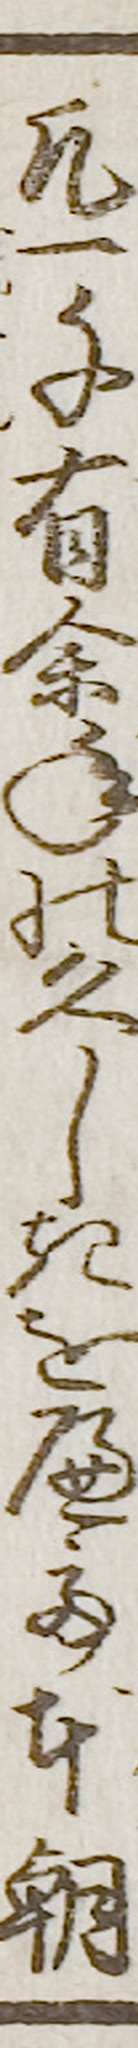凢一千有余年の久しきをへて本朝
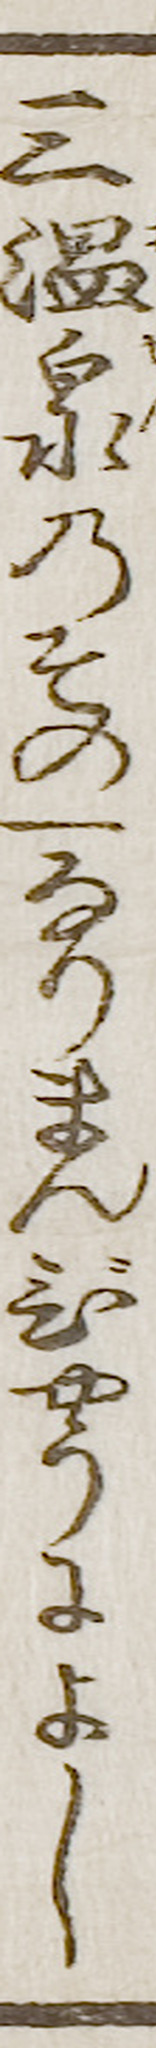三温泉のその一なりまんびやうによし
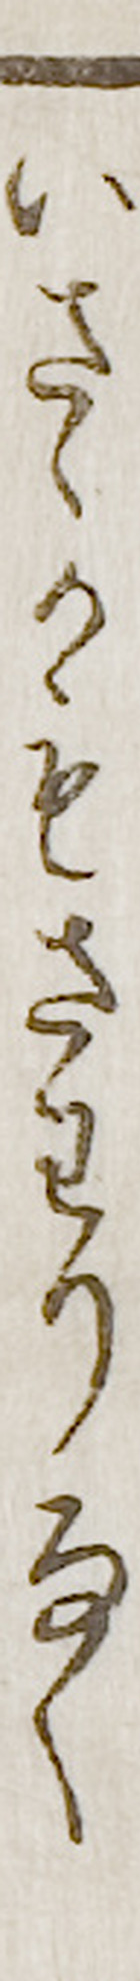いさゝかもさわりなく
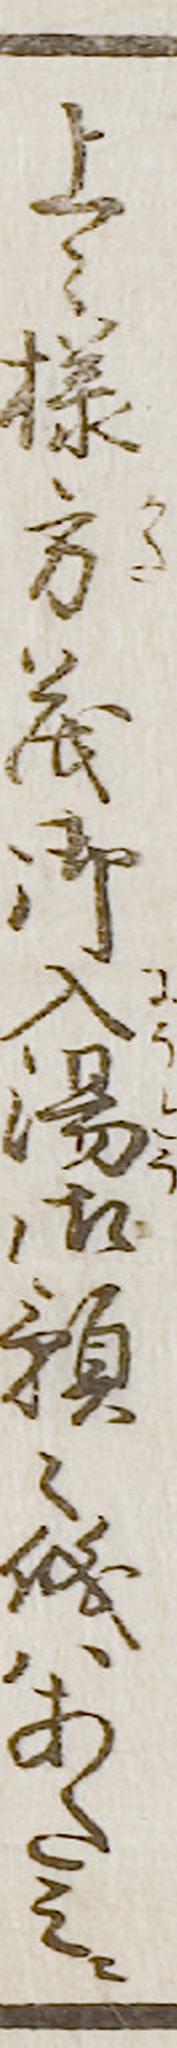上〻様方も御入湯御願之儀ハあたミニ
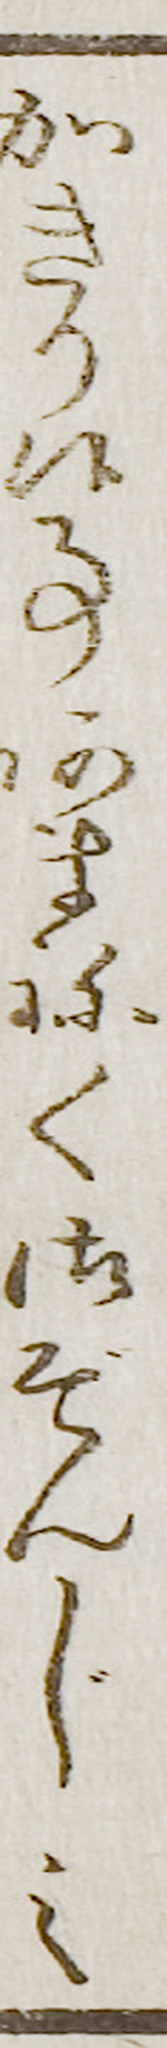かきり候事あまねく御ぞんじ之
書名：[豆州熱海温泉引札]
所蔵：東京大学総合図書館 General Library in the University of Tokyo, JAPAN
